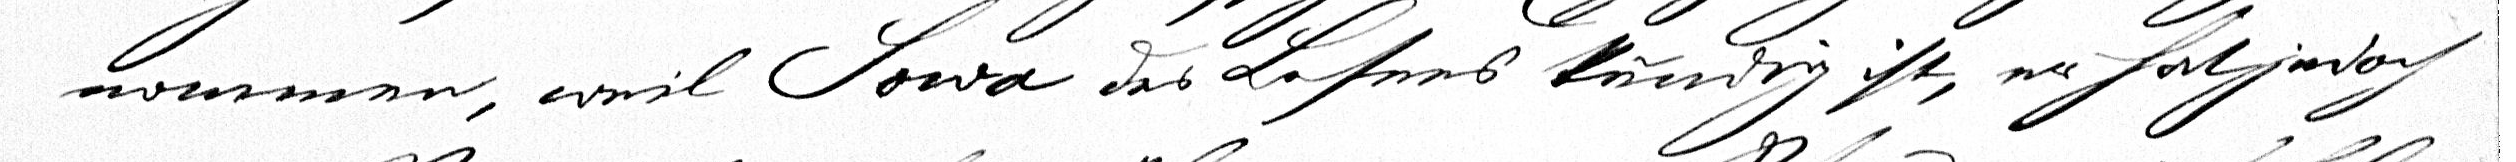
nommen, weil Sowa des Lesens kundig ist, er hat jedoch
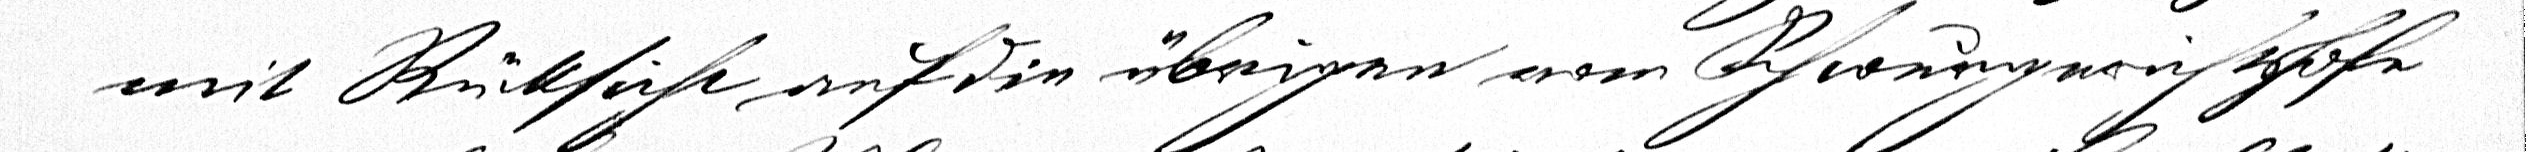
mit Rücksicht auf die übrigen vom Schwurgerichtshofe
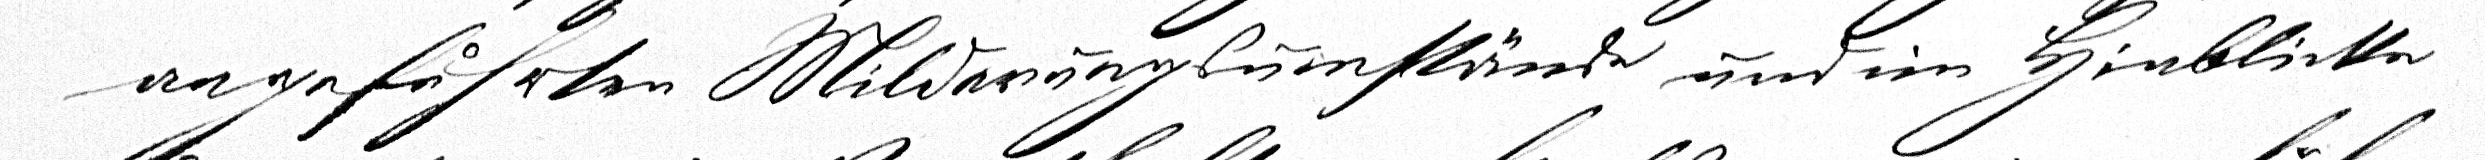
angeführten Milderungsumstände und im Hinblicke
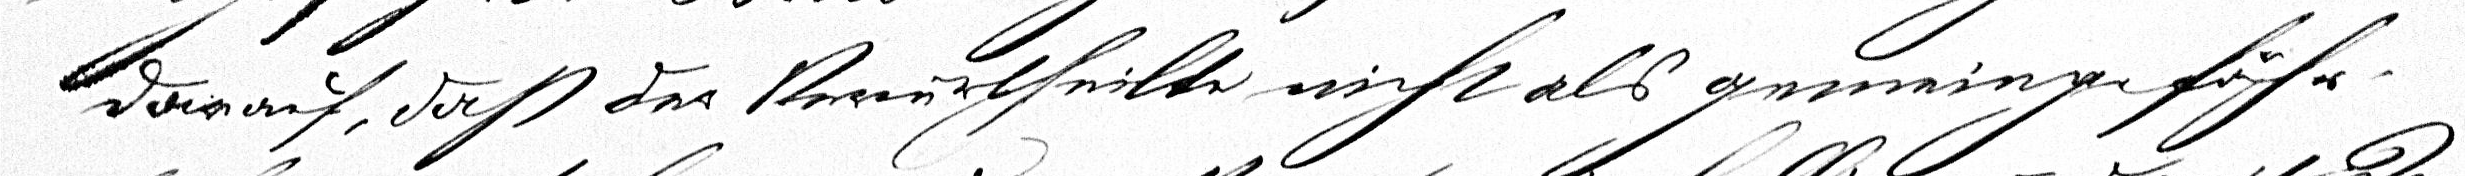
darauf, daß der Verurtheilte nicht als gemeingefähr¬
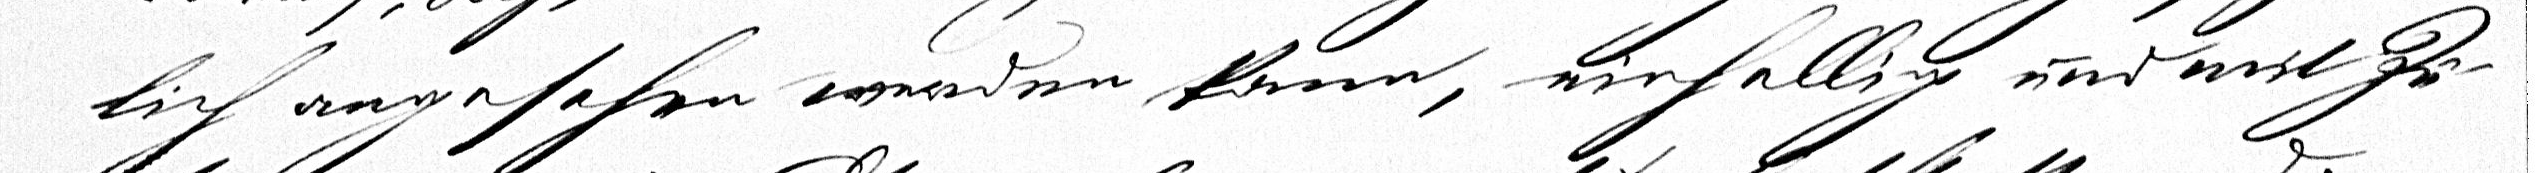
lich angesehen werden kann, einhellig und mit Zu¬
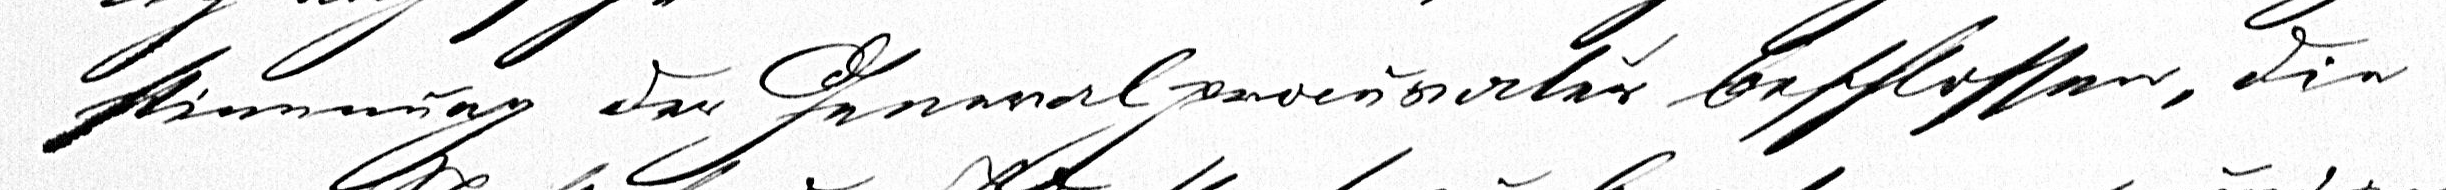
stimmung der Generalprocuratur beschlossen, die
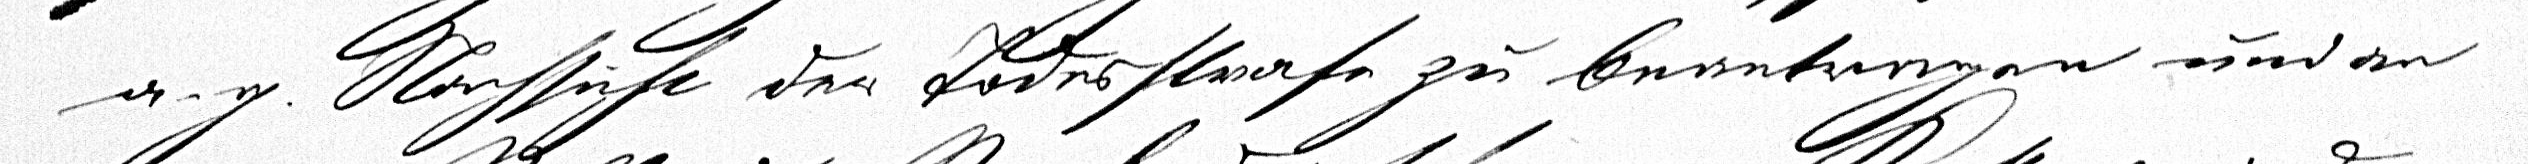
a. g. Nachsicht der Todesstrafe zu beantragen und an
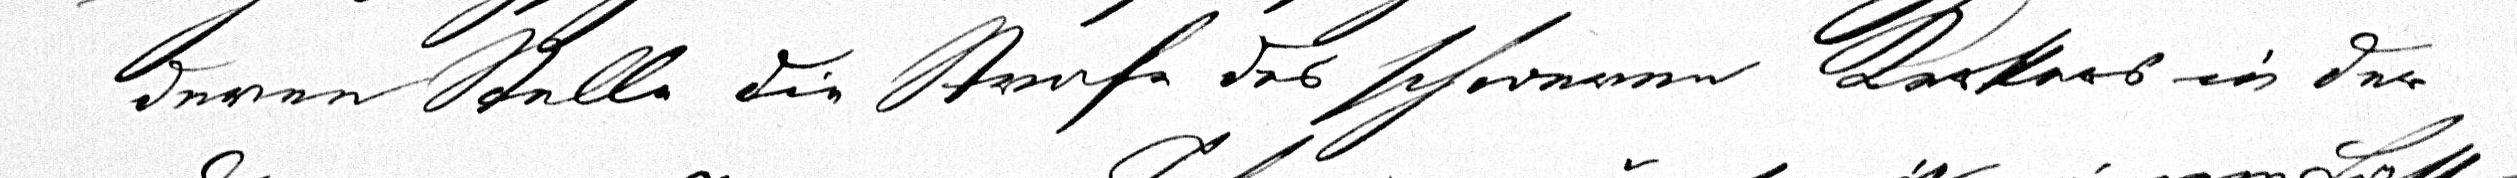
denen Stelle die Strafe des schweren Kerkers in der
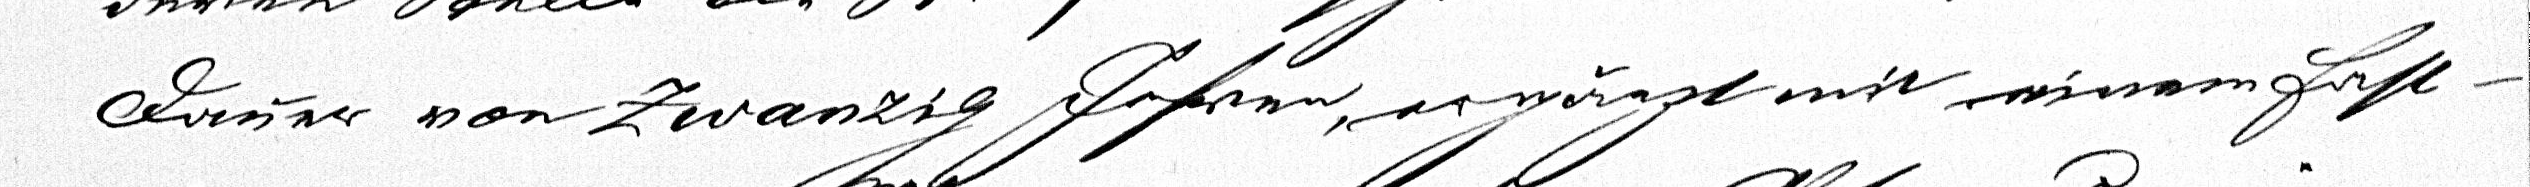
Dauer von Zwanzig Jahren, ergxxzt mit einem Fast¬
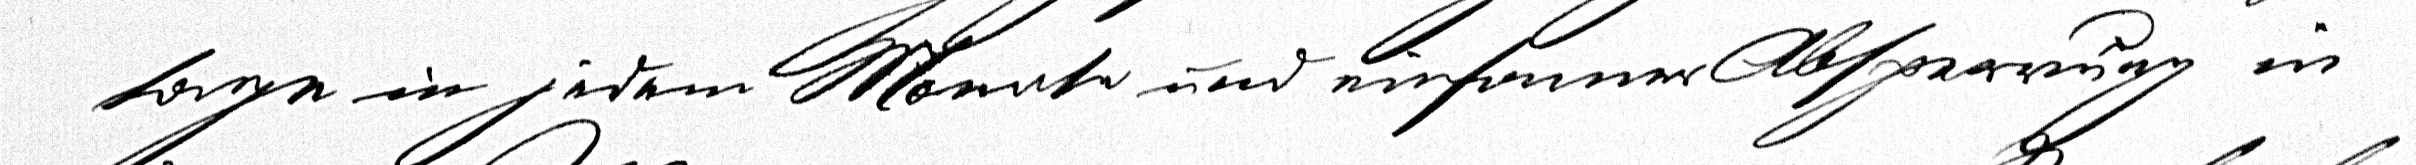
tage in jedem Monate einsamer Absperrung in
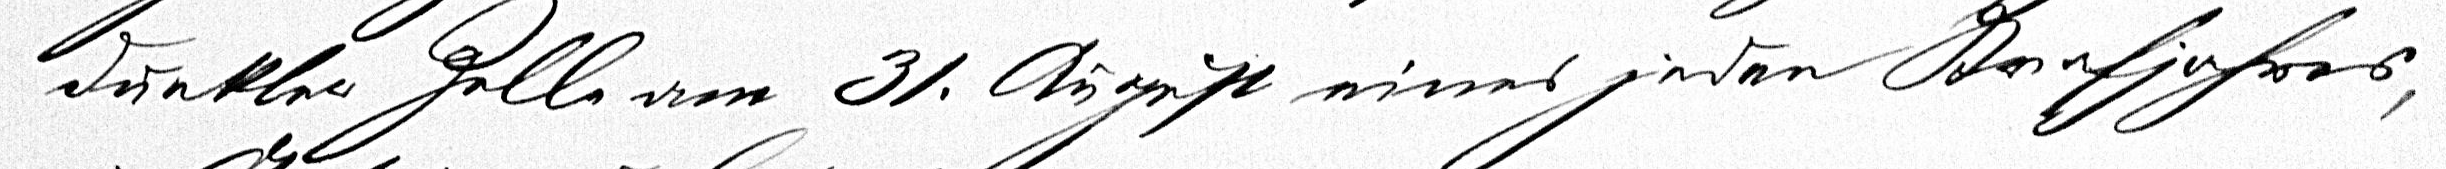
dunkler Zelle am 31. August eines jeden Strafjahres,
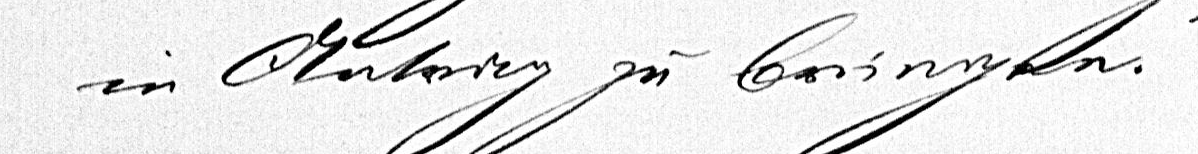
in Antrag zu bringen.
